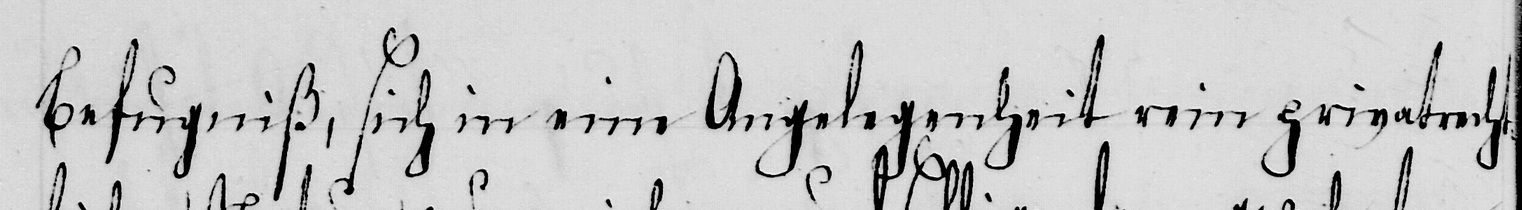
Befugniß, sich in eine Angelegenheit rein privatrech¬
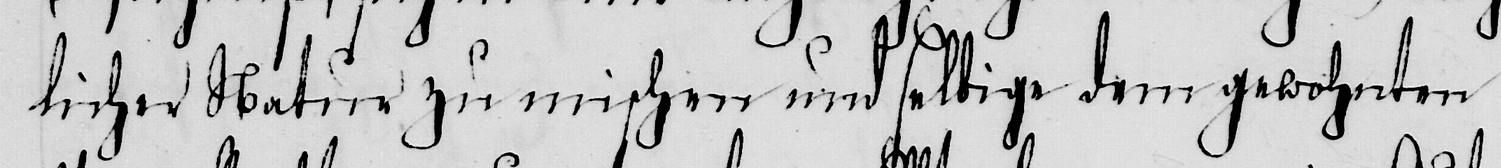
tlicher Natur zu mischen und selbige dem gewohnten
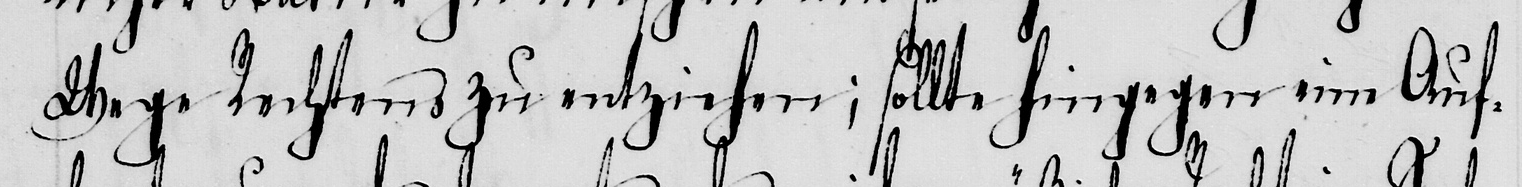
Wege Rechtens zu entziehen; sollte hingegen eine Auf¬
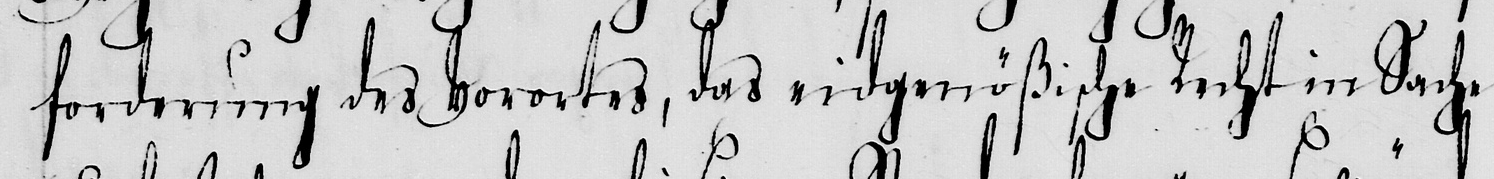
forderung des Vorortes, das eidgenößische Recht in Sache
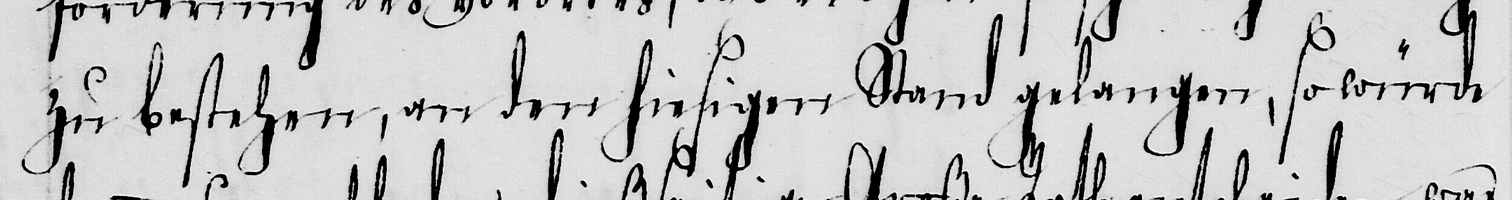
zu bestehen, an den hiesigen Stand gelangen, so würde
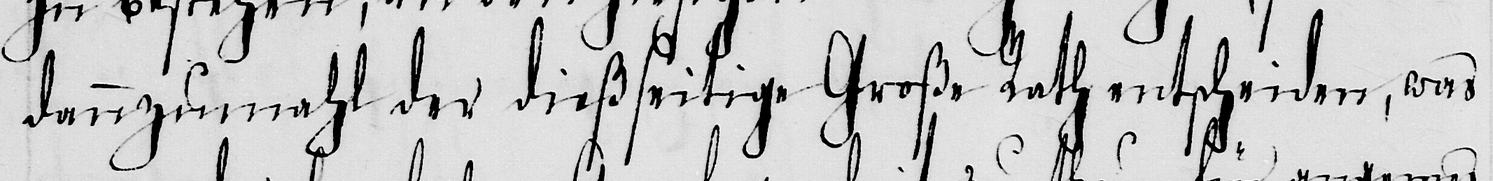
dannzumahl der dießseitige Große Rath entscheiden, was
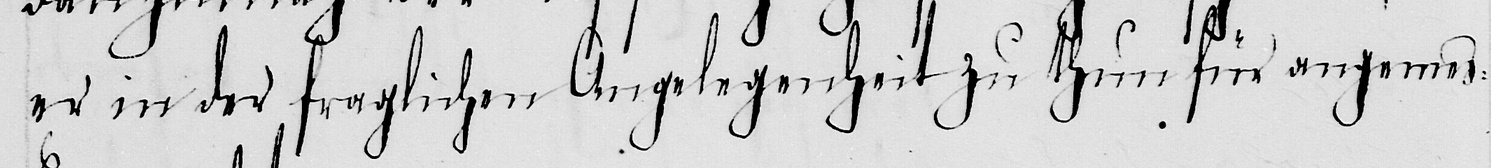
er in der fraglichen Angelegenheit zu thun für angeme¬
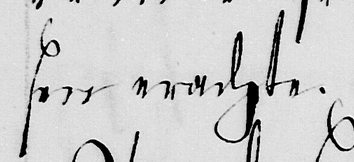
ßen erachte.
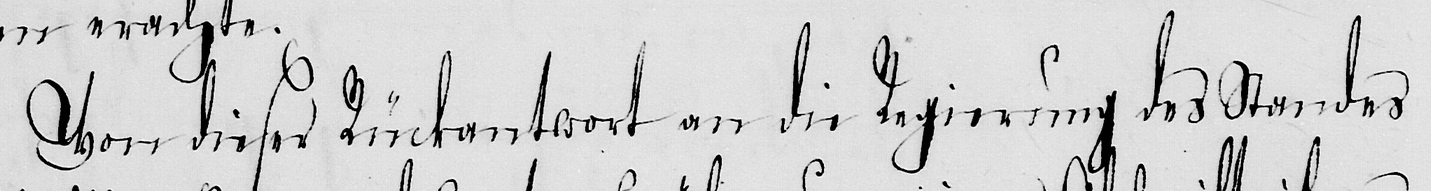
Von dieser Rückantwort an die Regierung des Standes
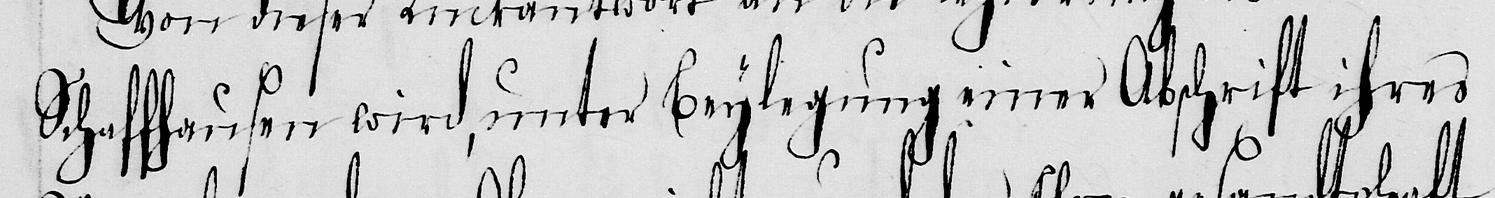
Schaffhausen wird, unter Beylegung einer Abschrift ihres
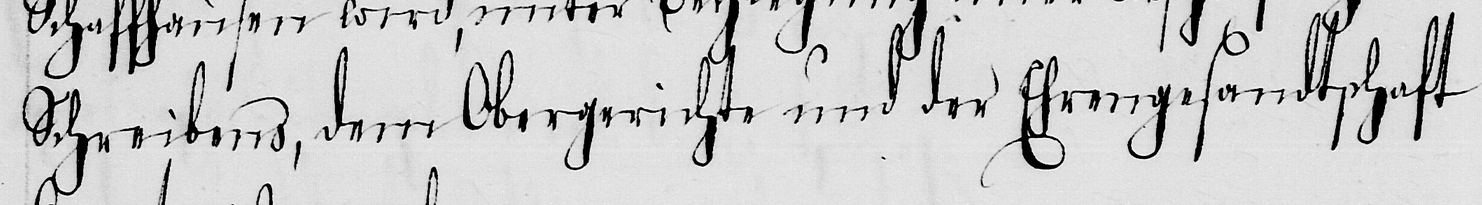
Schreibens, dem Obergerichte und der Ehrengesandtschaft
